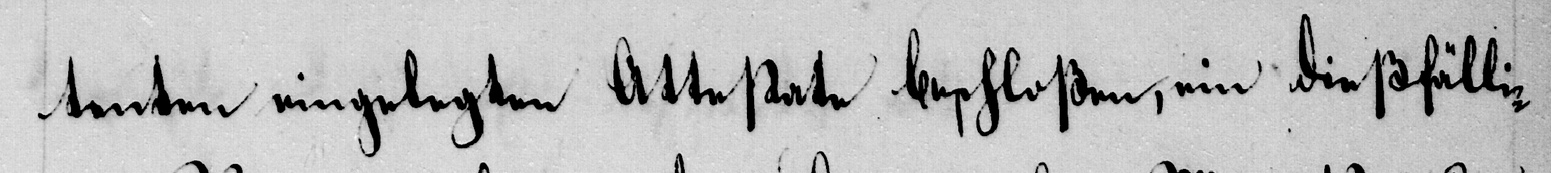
tenten eingelegten Attestate beschloßen, ein dießfälli¬
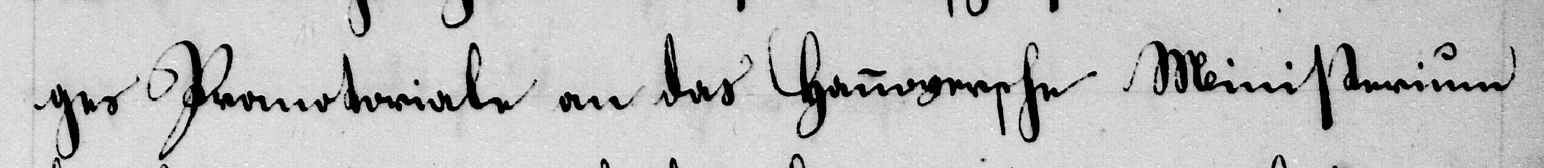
ges Promotoriale an das Hannoversche Ministerium
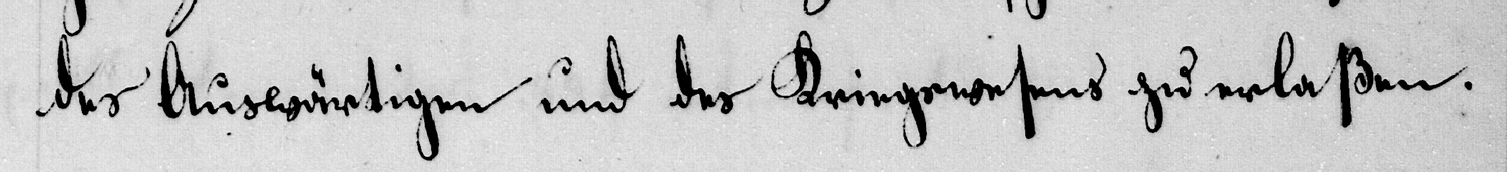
des Auswärtigen und des Kriegswesens zu erlaßen.
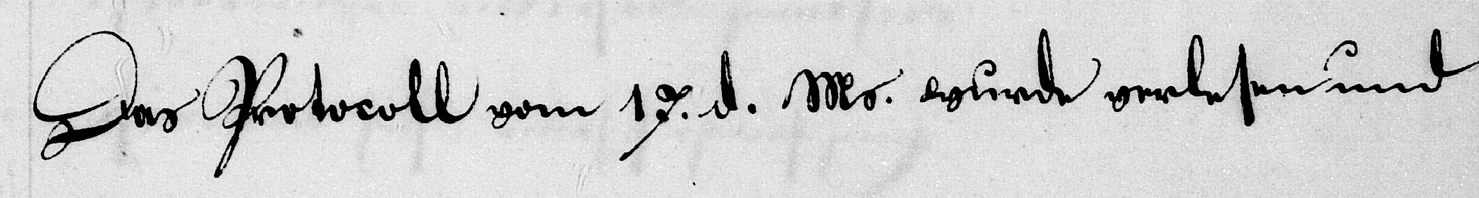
Das Protocoll vom 17. d. Ms. wurde verlesen und
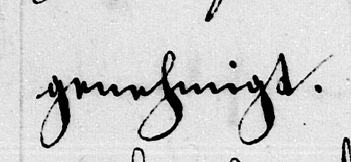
genehmigt.
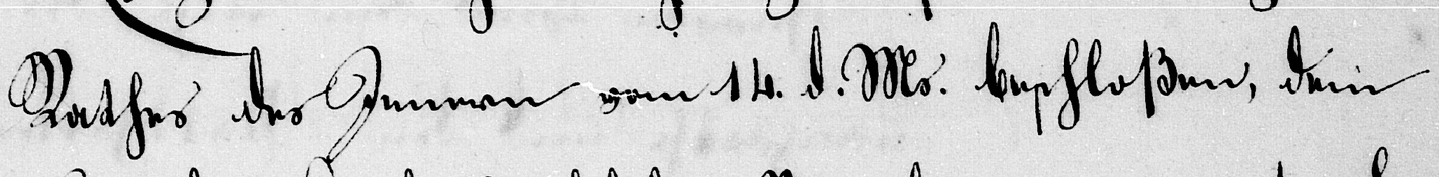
Rathes des Innern vom 14. d. Ms. beschloßen, dem
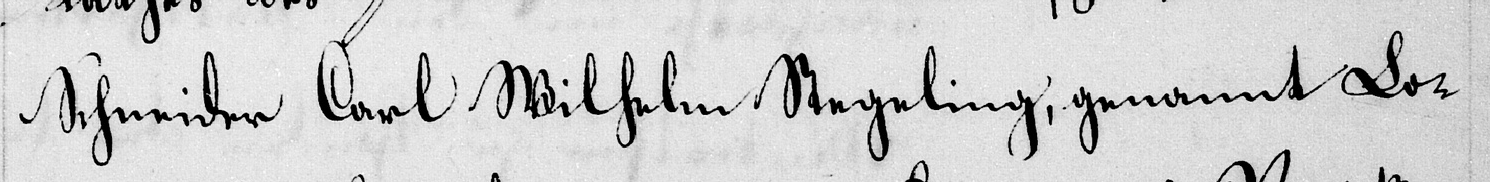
Schneider Carl Wilhelm Stegeling, genannt Lo¬
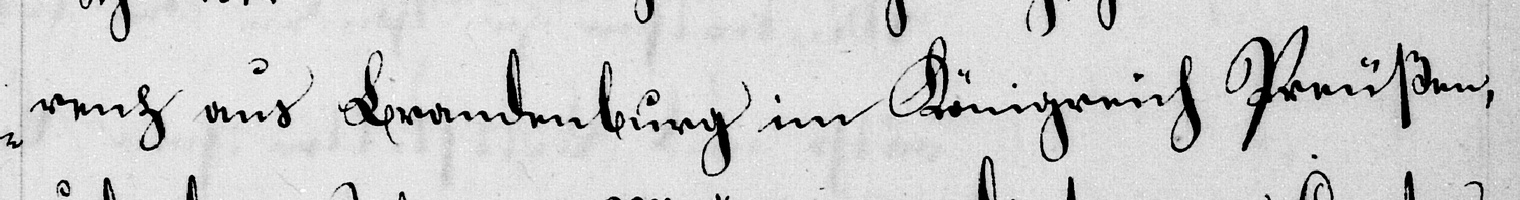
renz aus Brandenburg im Königreich Preußen,
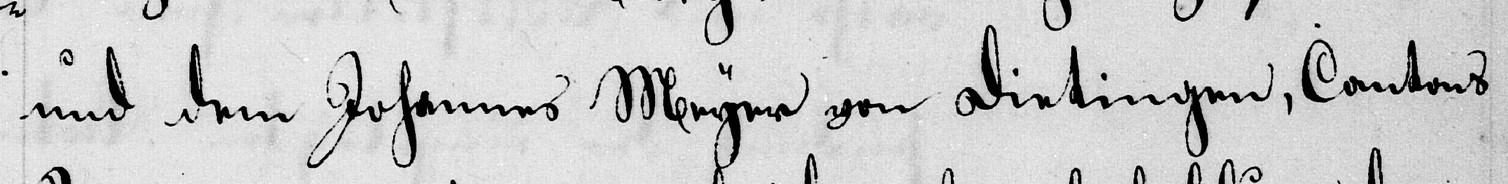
und dem Johannes Meyer von Dietingen, Cantons
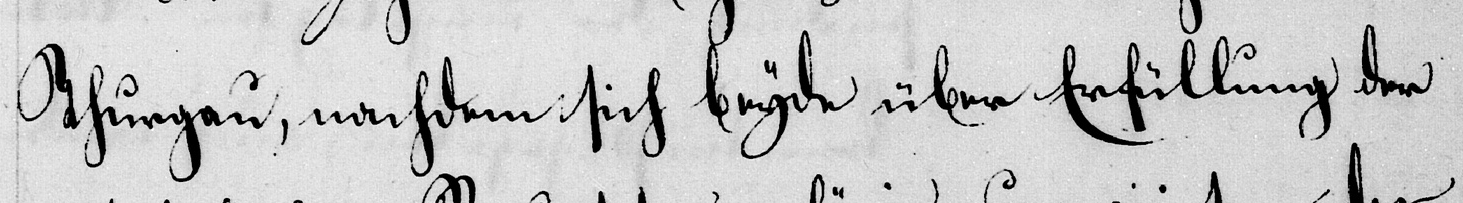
Thurgau, nachdem sich beyde über Erfüllung der
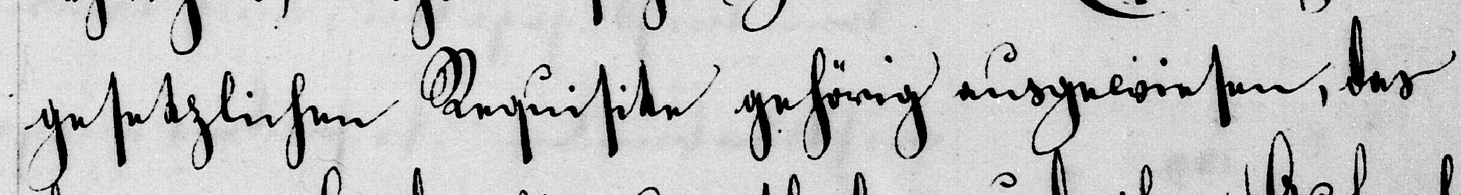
gesetzlichen Requisite gehörig ausgewiesen, das
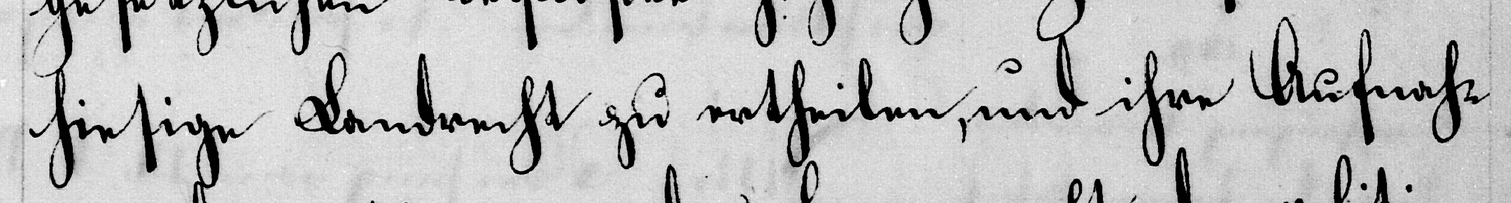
hiesige Landrecht zu ertheilen, und ihre Aufnah¬
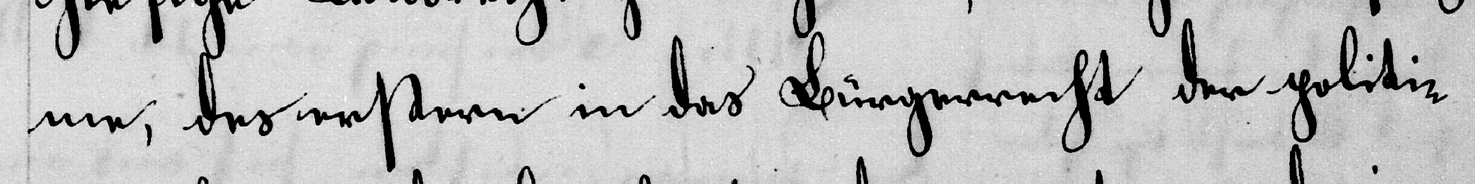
me, des erstern in das Bürgerrecht der politi¬
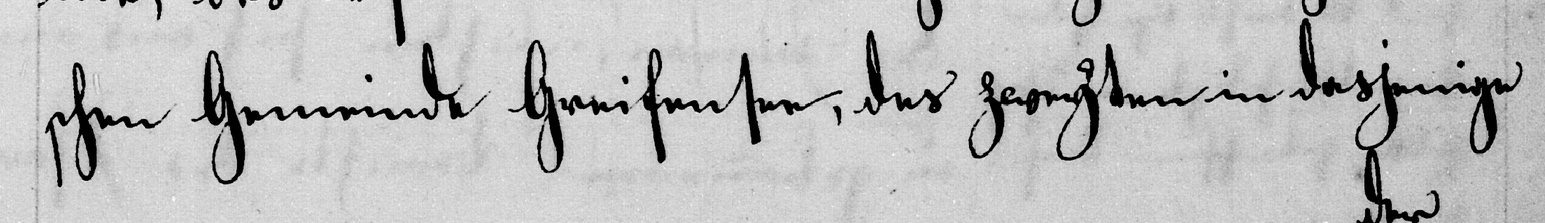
schen Gemeinde Greifensee, des zweyten in dasjenige
